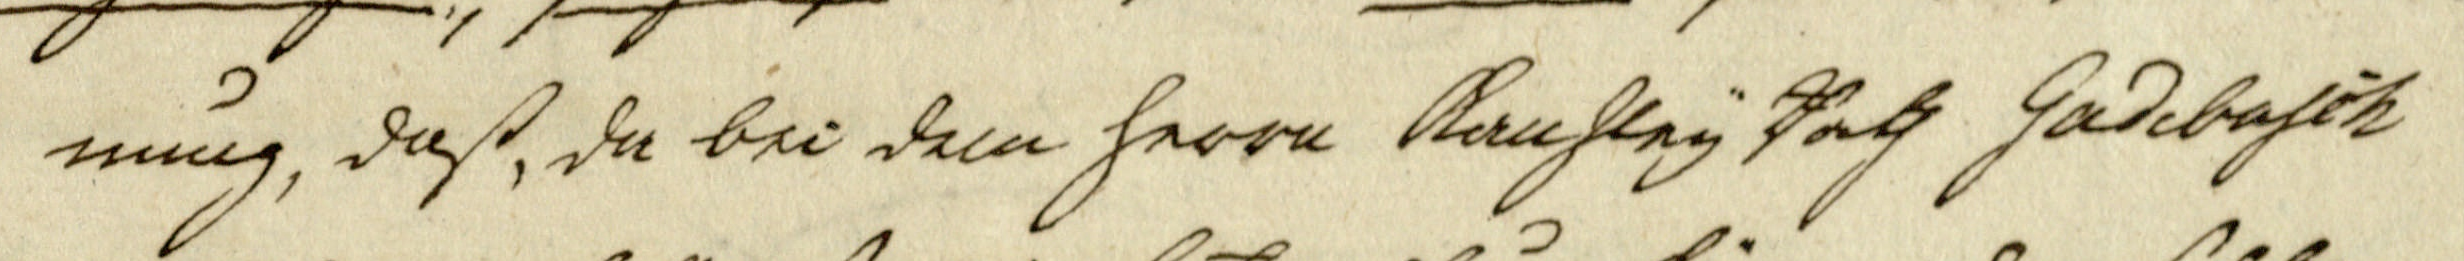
nung, daß, da bei dem herrn Kanzleÿ Rath Gadebusch
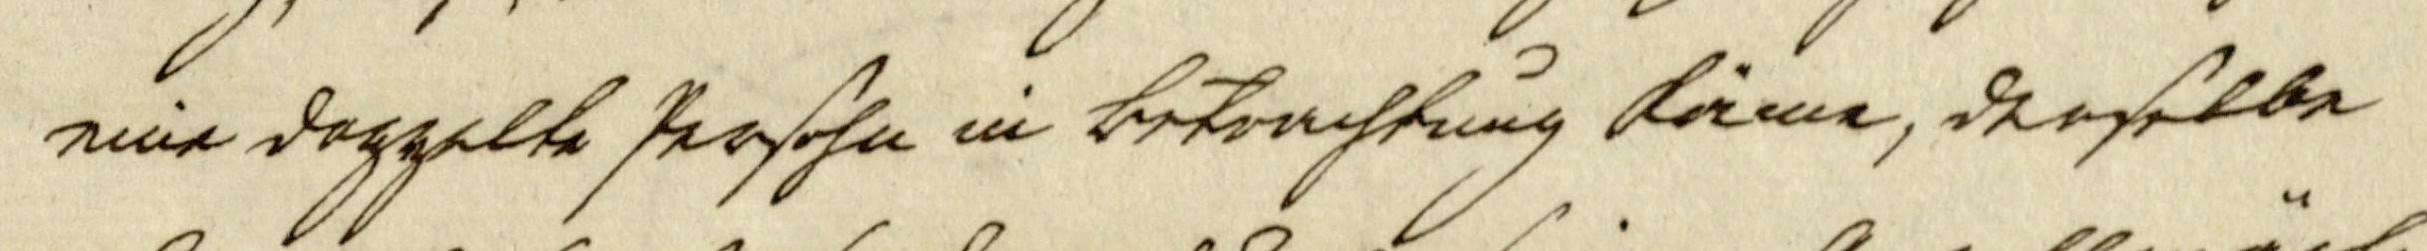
eine doppelte Persohn in Betrachtung käme, derselbe
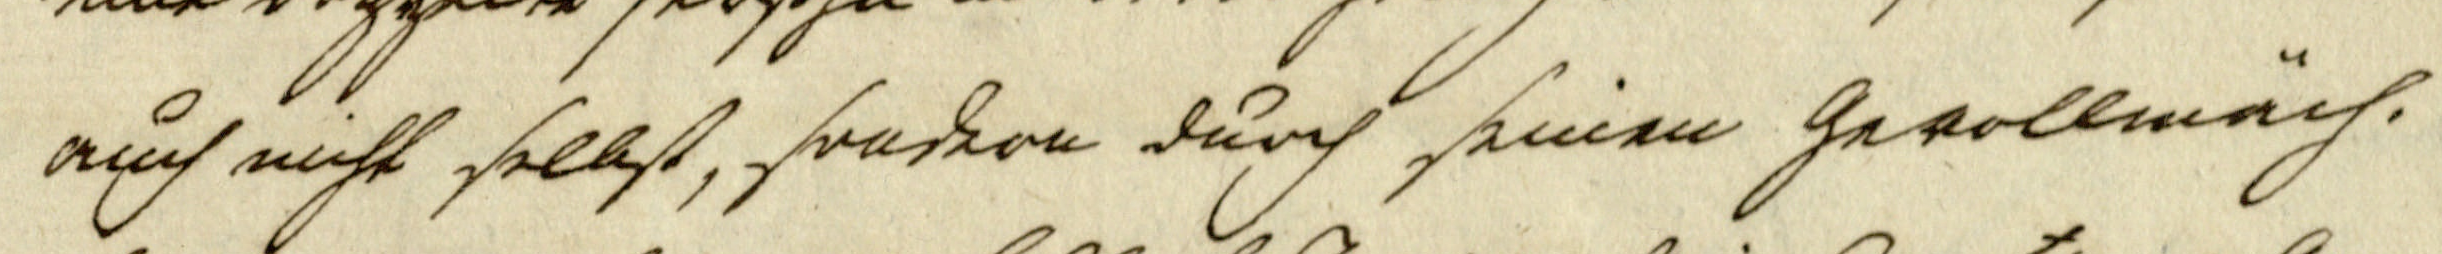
auch nicht selbst, sondern durch seinen Gevollmäch¬
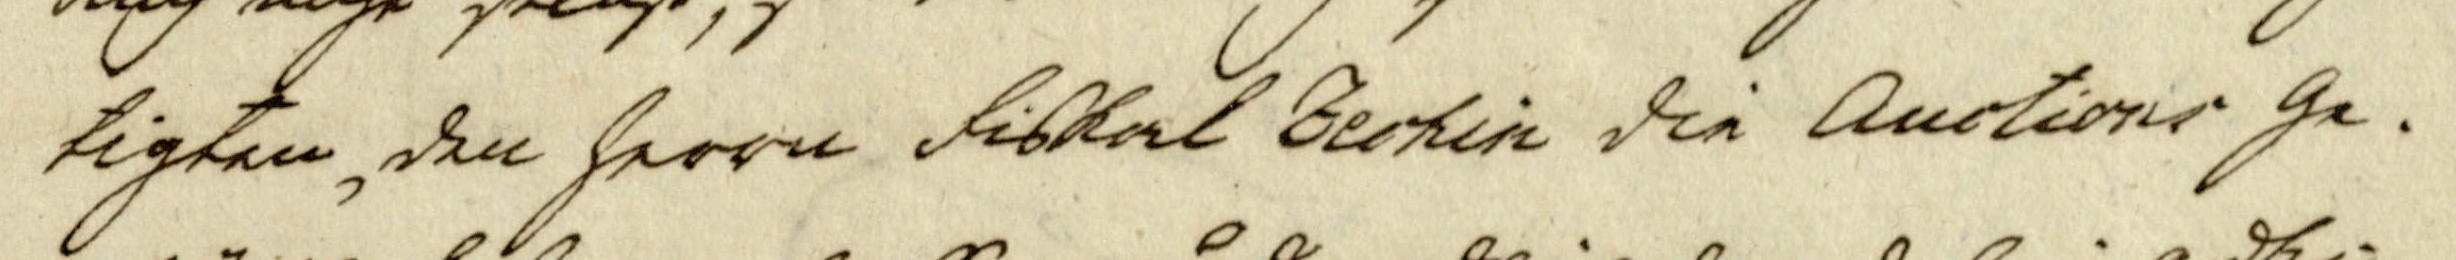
tigten, den herrn Fiskal Zechin die Auctions Ge¬
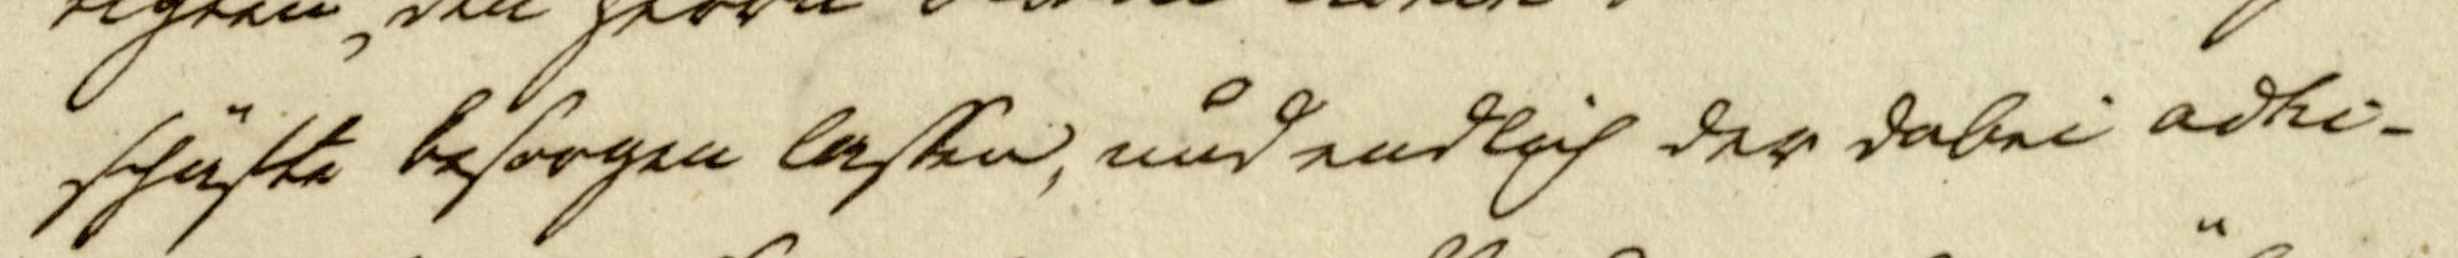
schäfte besorgen lassen, und endlich der dabei adhi¬
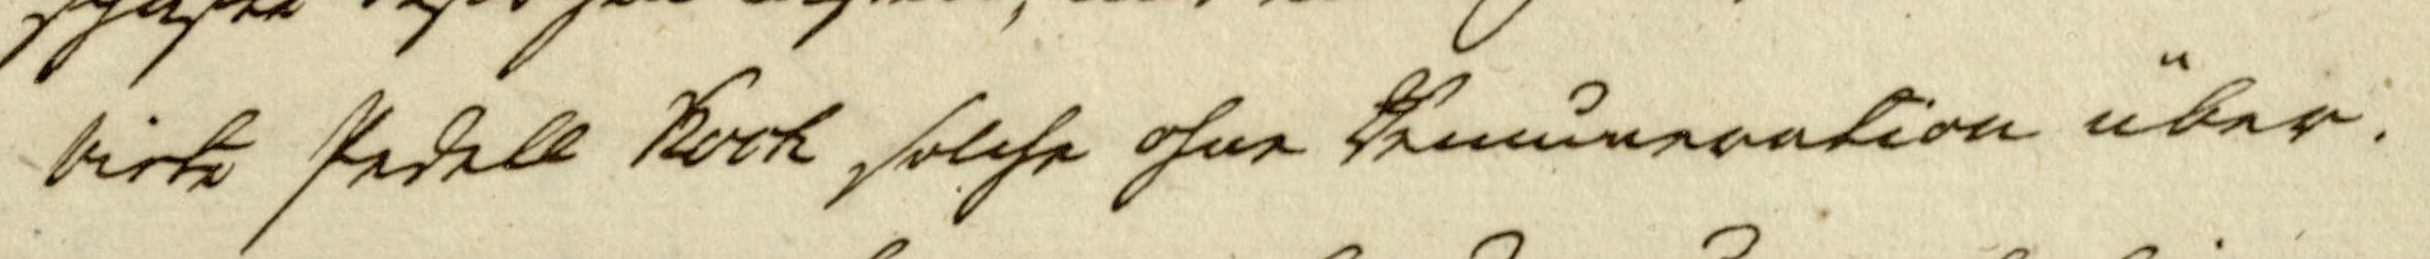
birte Pedell Koch solche ohne Renumeration über¬
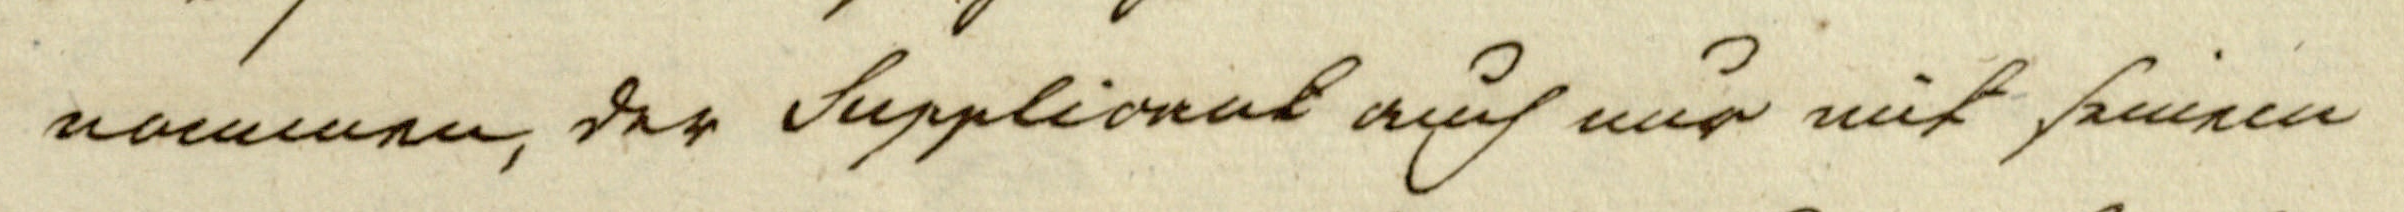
nommen, der Supplicant auch nur mit seinem
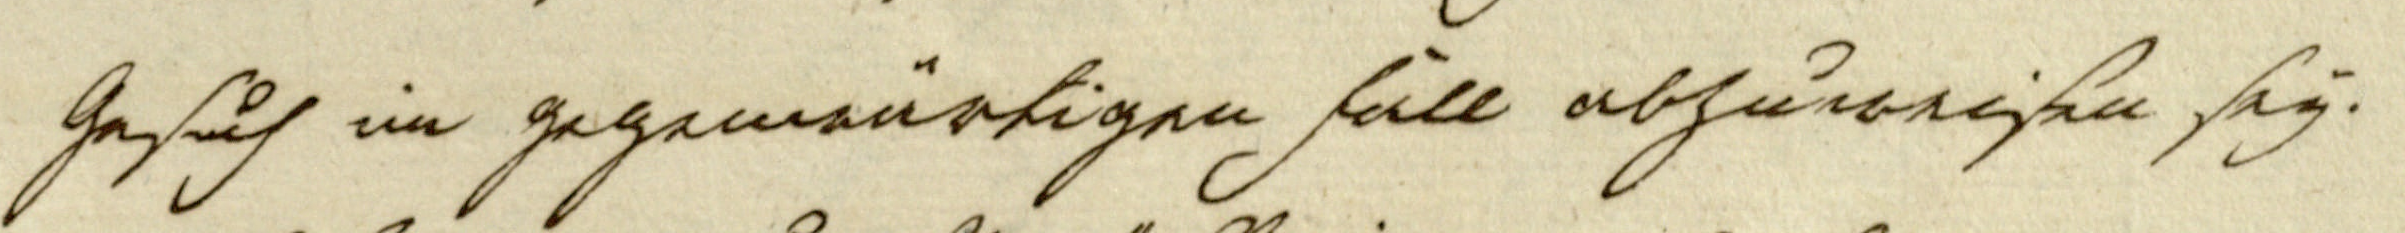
Gesuch im gegenwärtigen Fall abzuweisen seÿ.
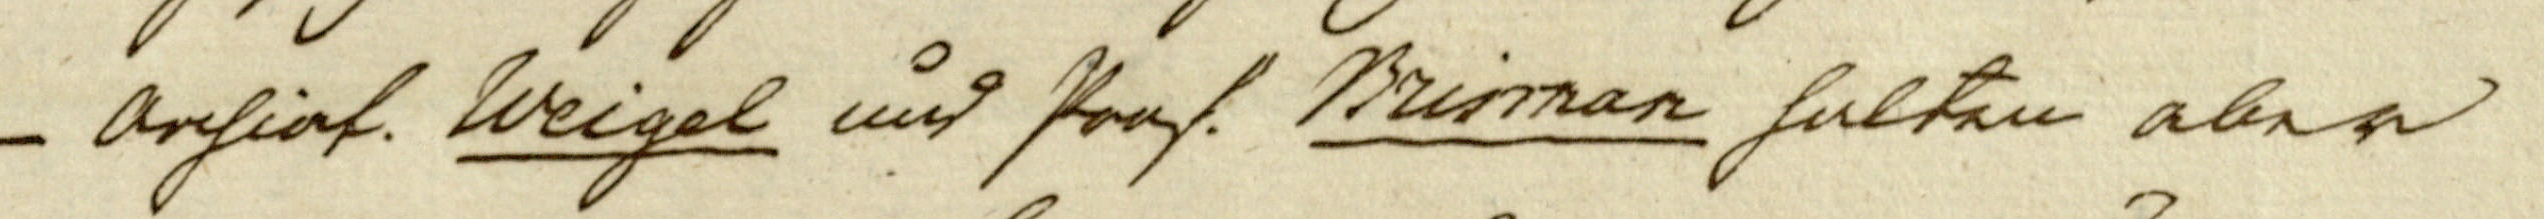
Archiat. Weigel und Prof. Brisman halten aber
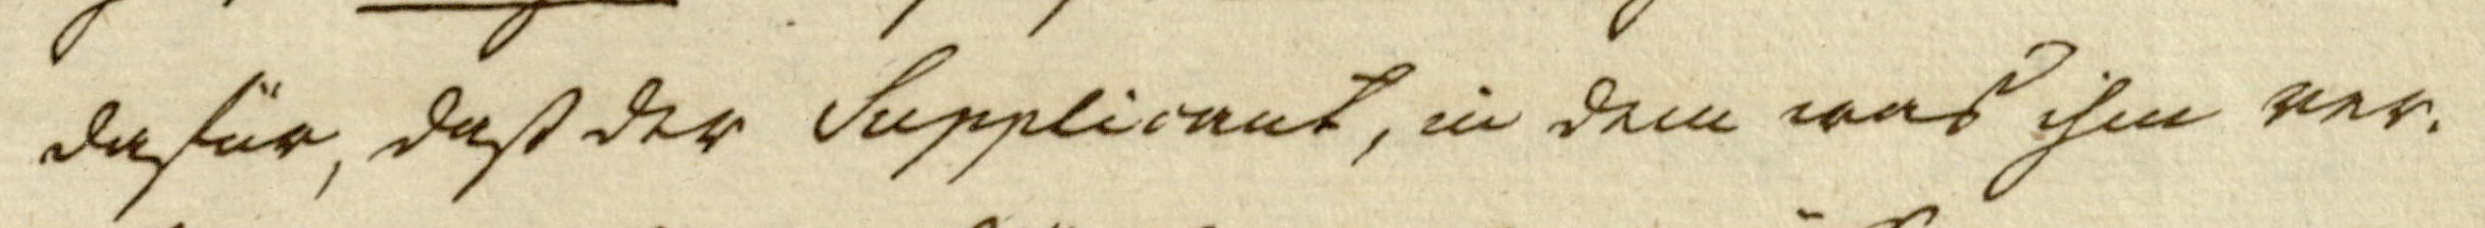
dafür, daß der Supplicant, in dem was ihm ver¬
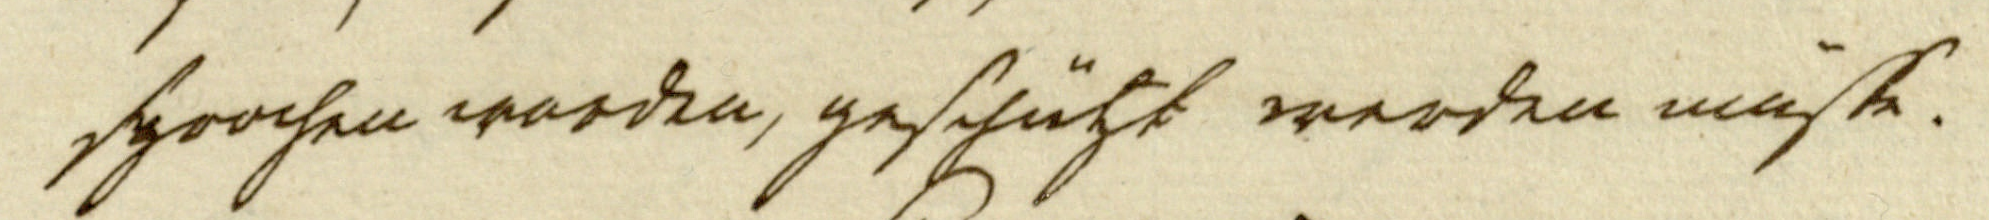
sprochen worden, geschützt werden müsse.
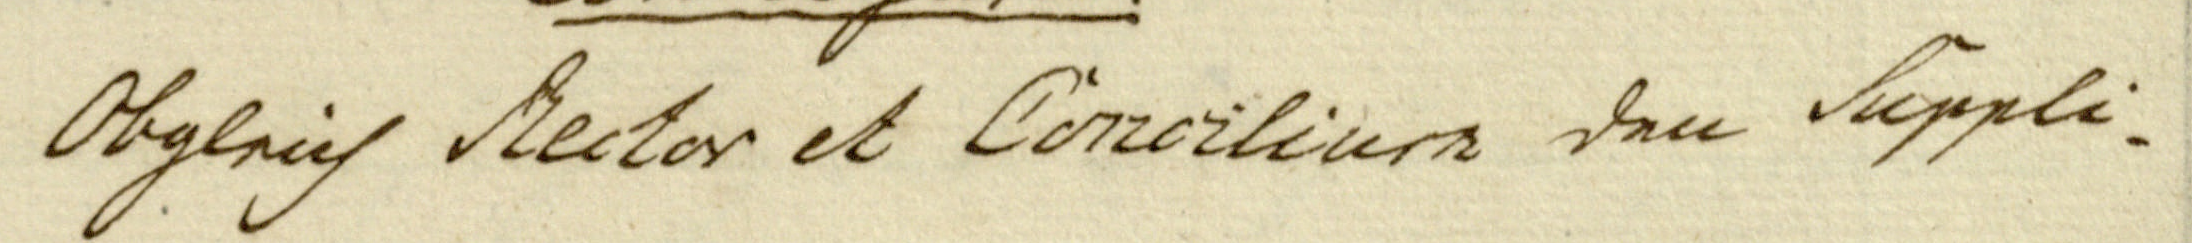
Obgleich Rector et Concilium den Suppli¬
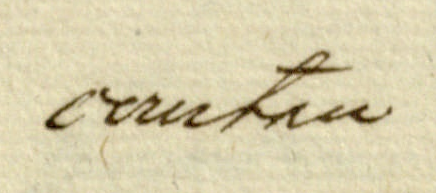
canten
